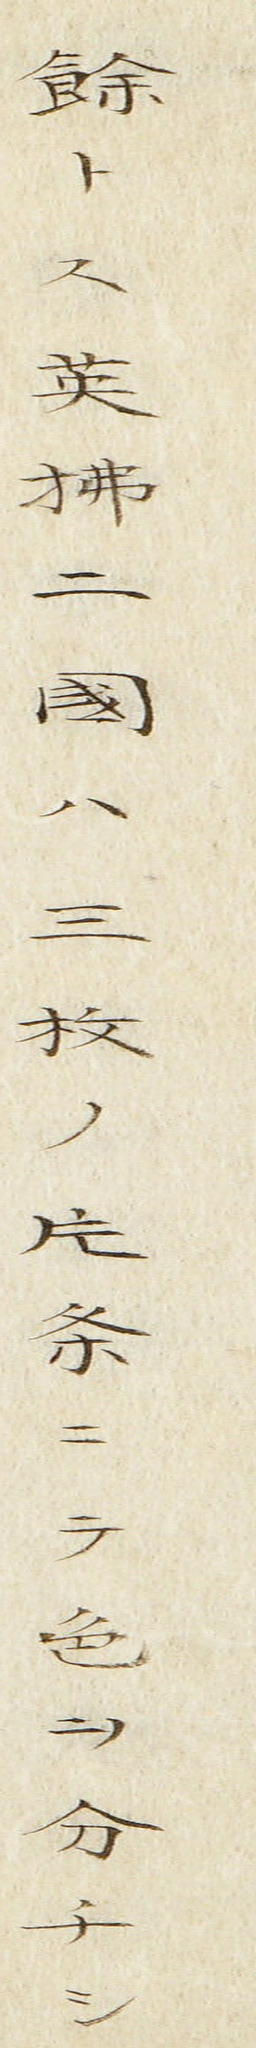余トス英拂二国ハ三枚ノ片条ニテ色ヲ分チシ
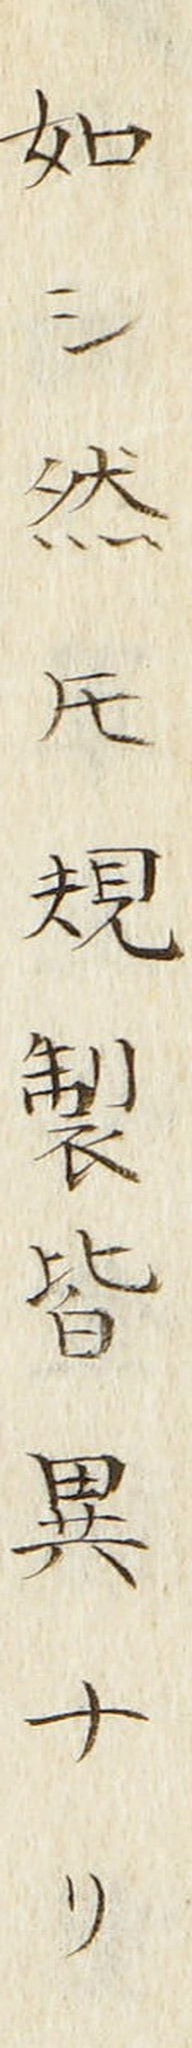如シ然ドモ規製皆異ナリ
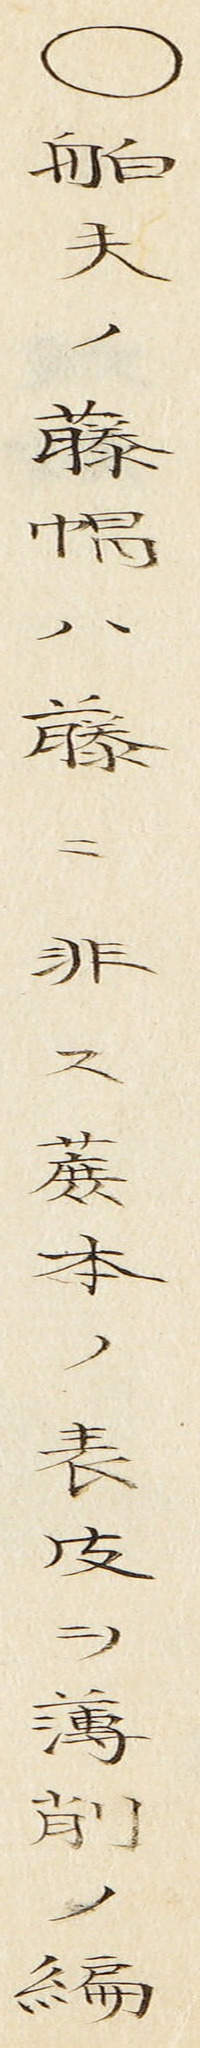〇舶夫ノ藤帽ハ藤ニ非ス蔗本ノ表皮ヲ薄削シテ編
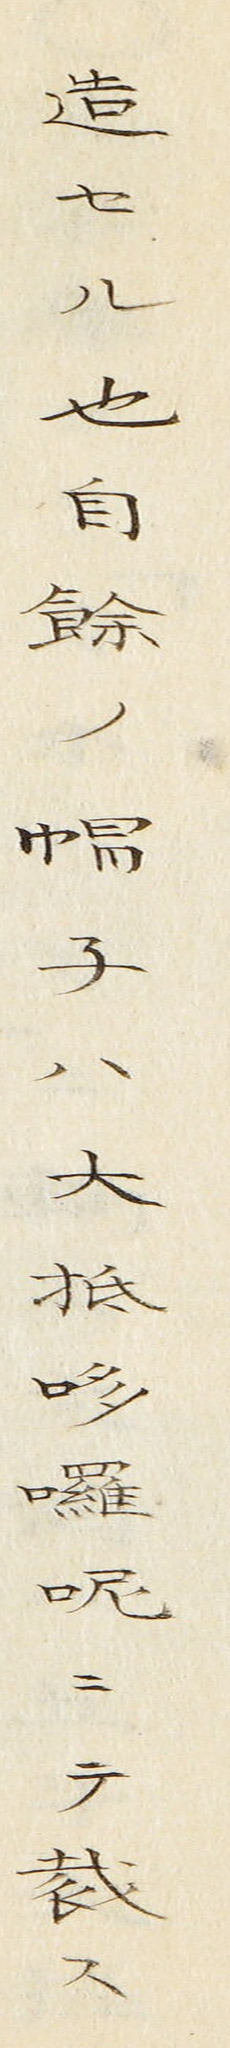造セル也自余ノ帽子ハ大抵哆囉呢ニテ裁ス
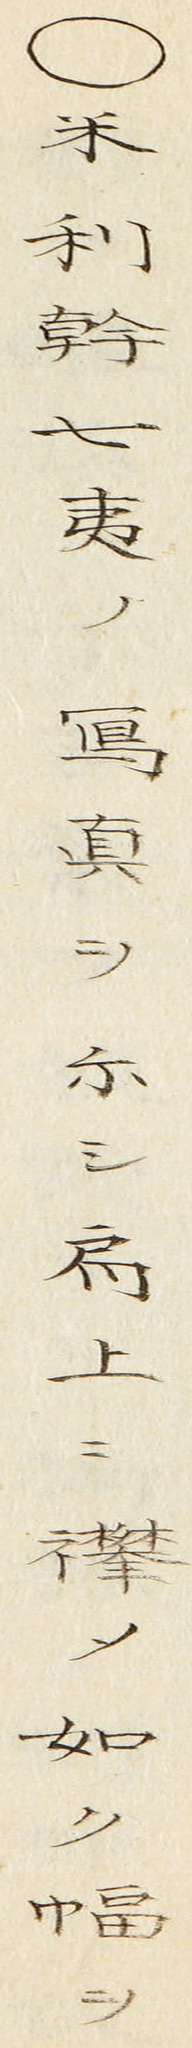〇米利幹七夷ノ写真ヲ尓シ肩上ニ襷シテ如ク幅ヲ
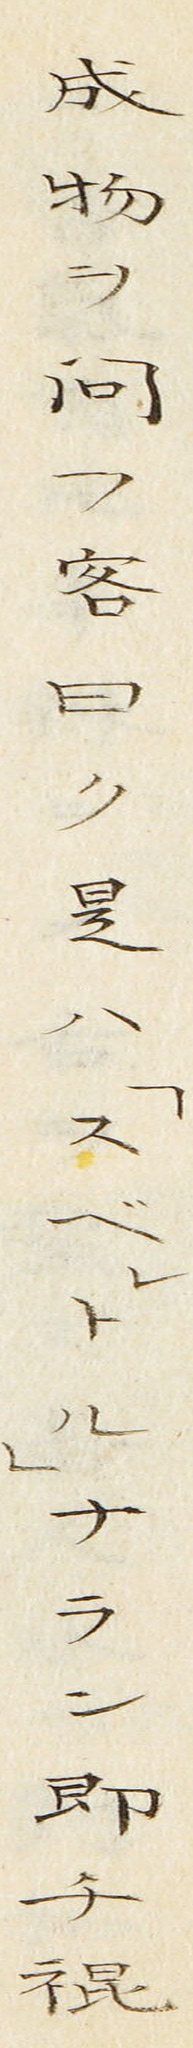成物ヲ問フ客曰ク是ハ「スベトル」ナラン即チ
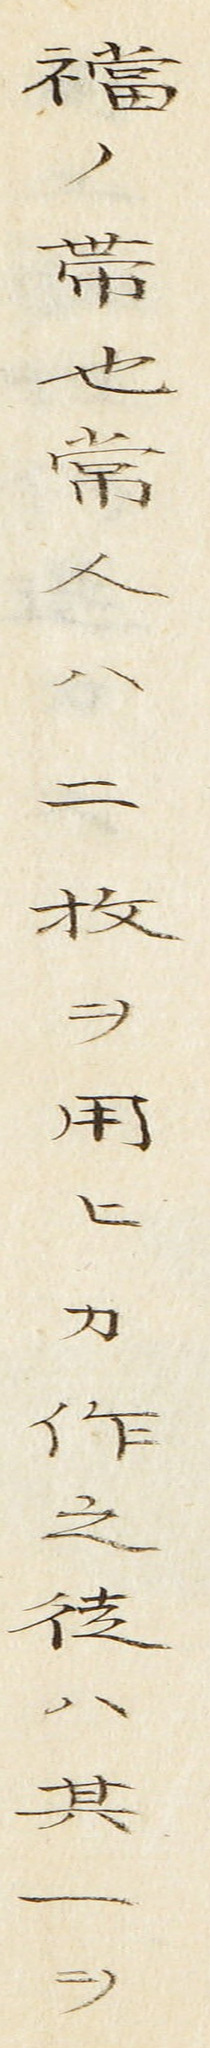襠ノ帯也常人ハ二枚ヲ用ヒ力作之徒ハ其一ヲ
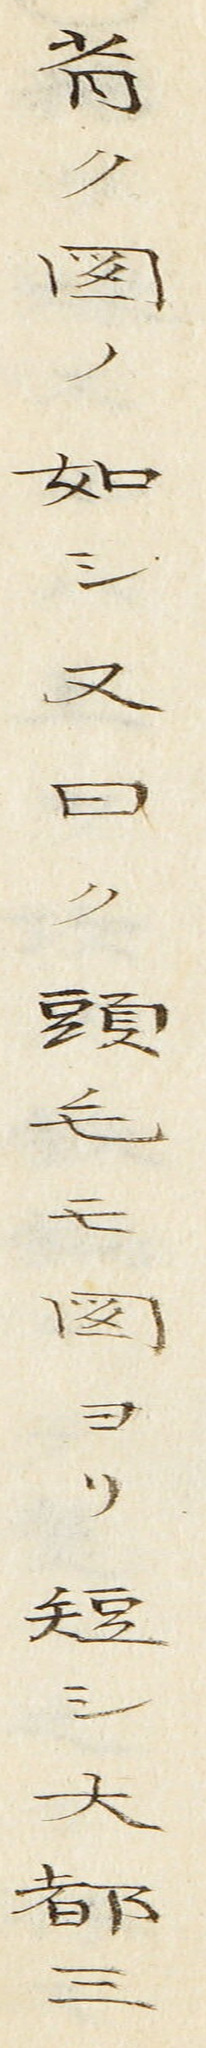省ク図ノ如シ又曰ク頭毛モ図ヨリ短シ大都三
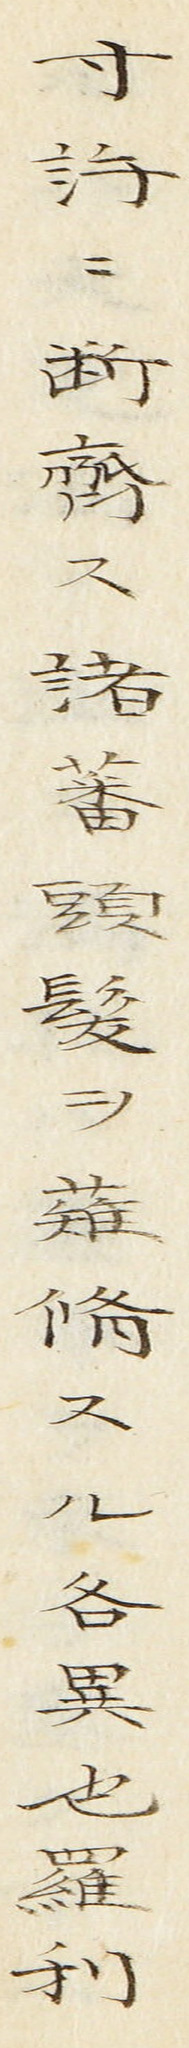寸許ニ断斉ス諸蕃頭髪ヲ薙洲修スル各異也羅利
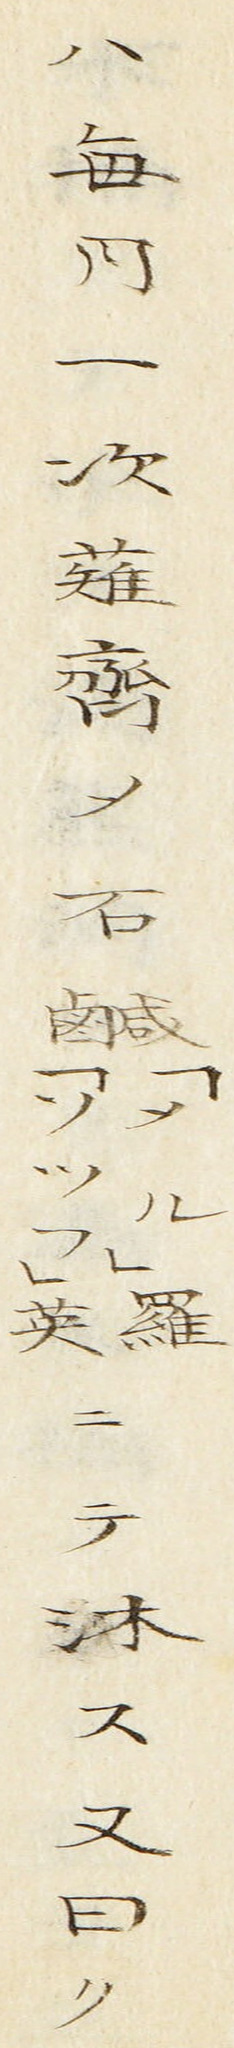ハ毎月一次薙斉シテ石鹸「メル」羅「ソツフ」英ニテ沐ス又曰ク
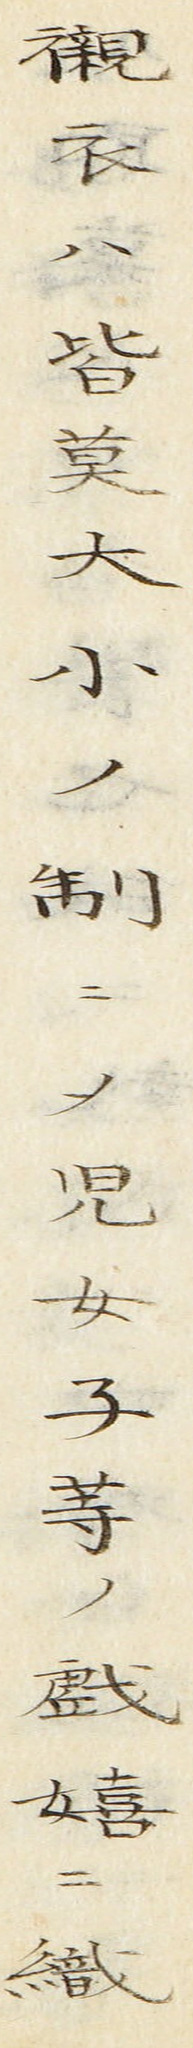襯衣ハ皆莫大小ノ制ニシテ児女子等ノ戯嬉ニ織
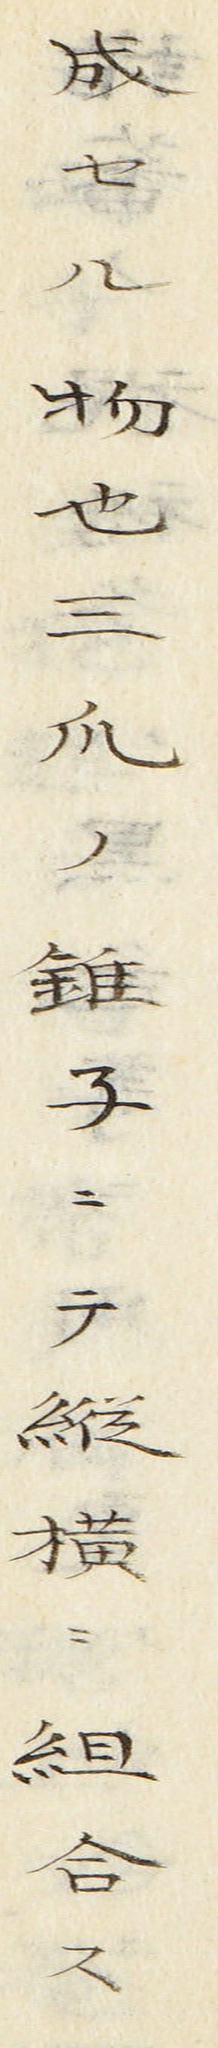成セル物也三爪ノ錐子ニテ縦横ニ組合ス

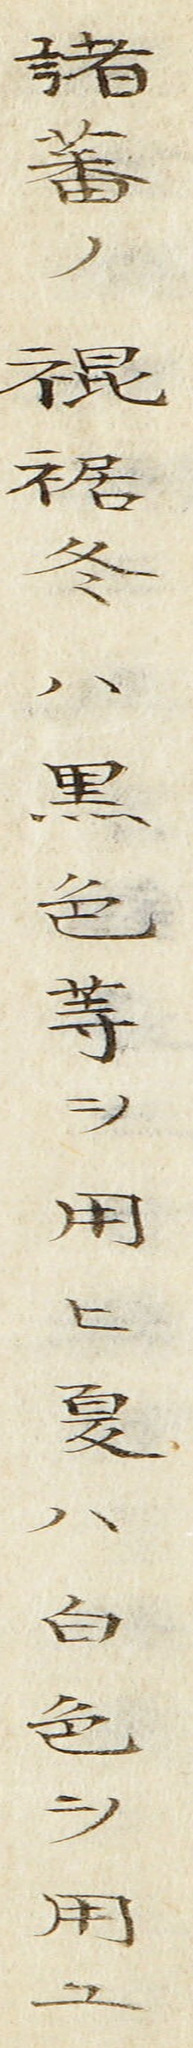諸藩ノ裩裾冬ハ黒色等ヲ用ヒ夏ハ白色ヲ用ユ
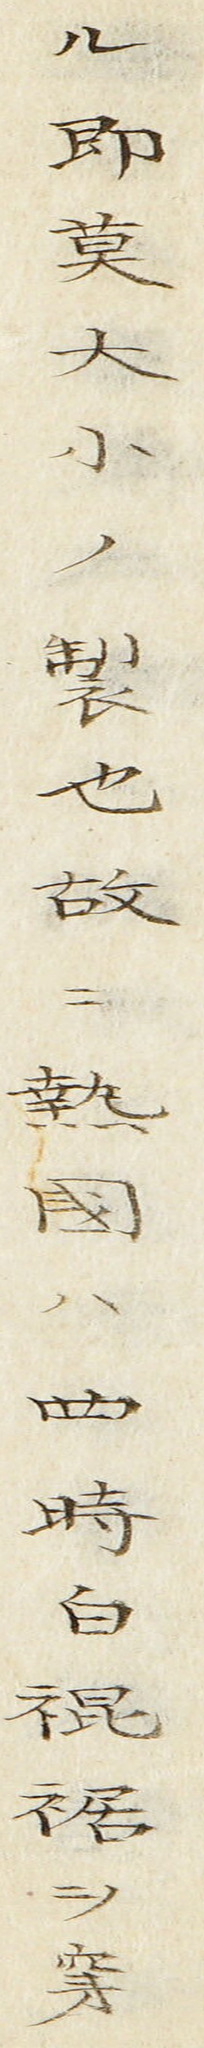ル即莫大小ノ製也故ニ熱国ハ四時白裩裾ヲ穿
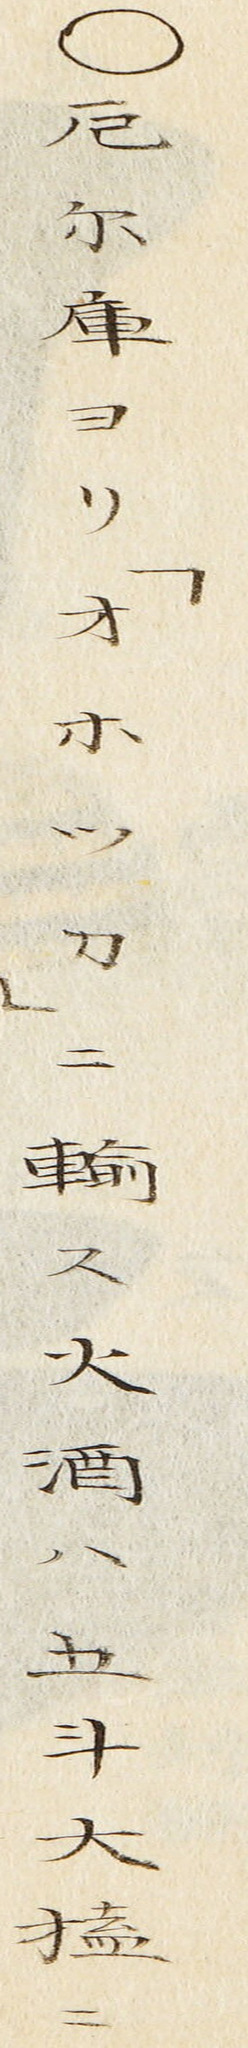〇厄尓庫ヨリ「オホツカ」ニ輸ス火酒ハ五斗大搕ニ
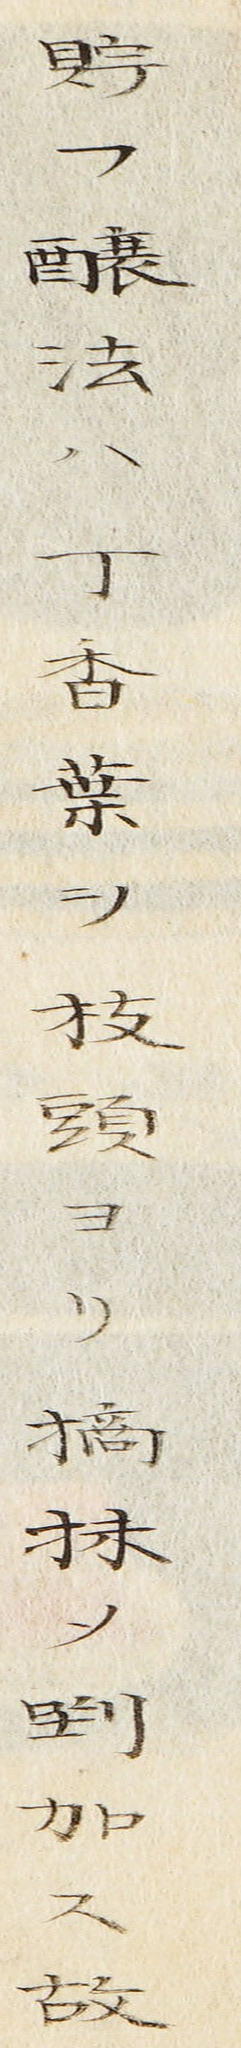貯フ醸法ハ丁香葉ヲ枝頭ヨリ摘抺シテ剉加ス故
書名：蕃談
